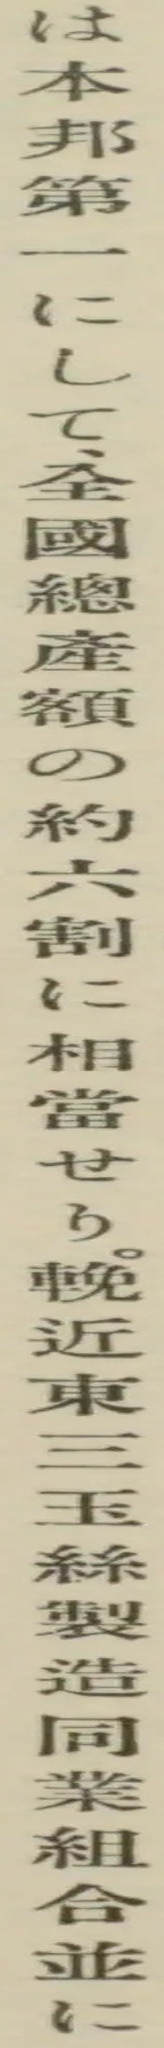は本邦第一にして、全国産額の約六割に相当せり。輓近東三玉絲製造同業組合並に
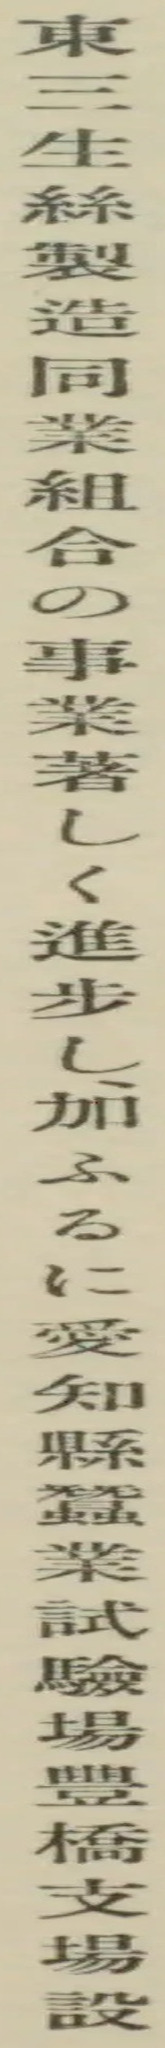東三生絲製造同業組合の事業著しくしんぽ進歩し、加ふるに愛知県蠶業試験場豊橋詩支場設
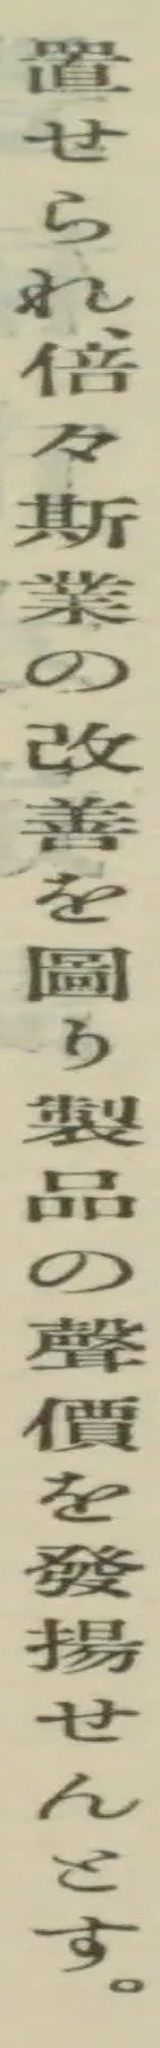置せられ、倍々斯業の改善を圖り製品の聲價を発揚せんとす。
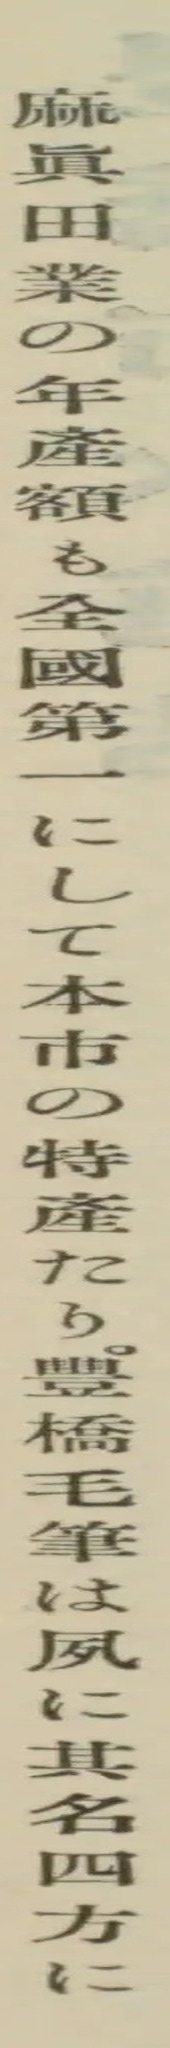麻真田業の年産額も全国第一にして本市の特産たり。豊橋毛筆は夙に其名四方に
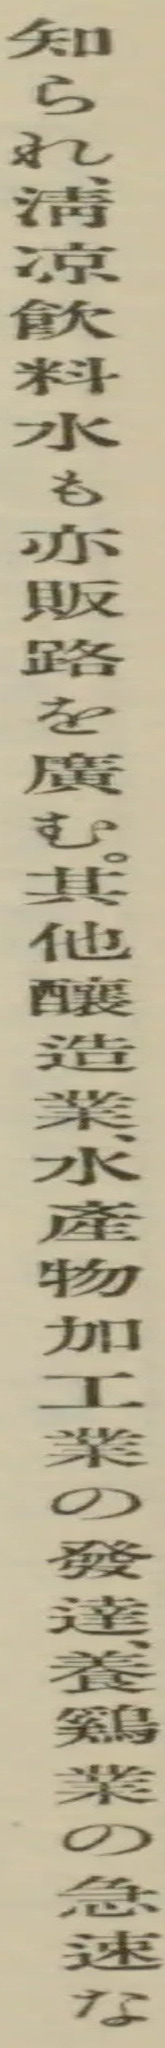知られ、清涼飲料水も亦販路を廣む。其他醸造業、水産加工業の発達、養鶏業の急速な
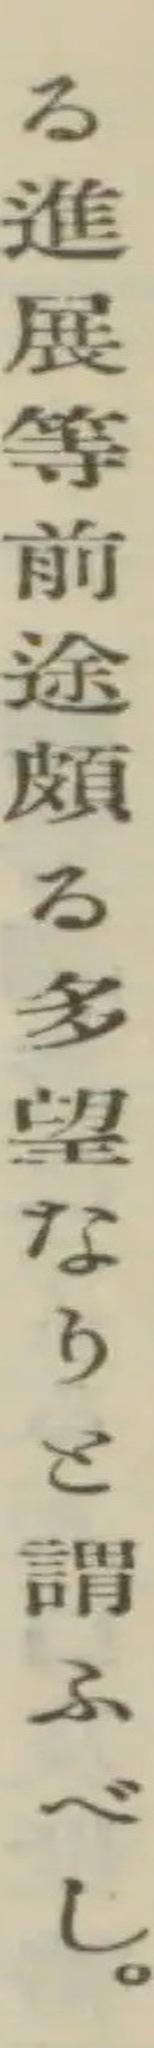る進展等前途頗る多望んりと謂ふべし
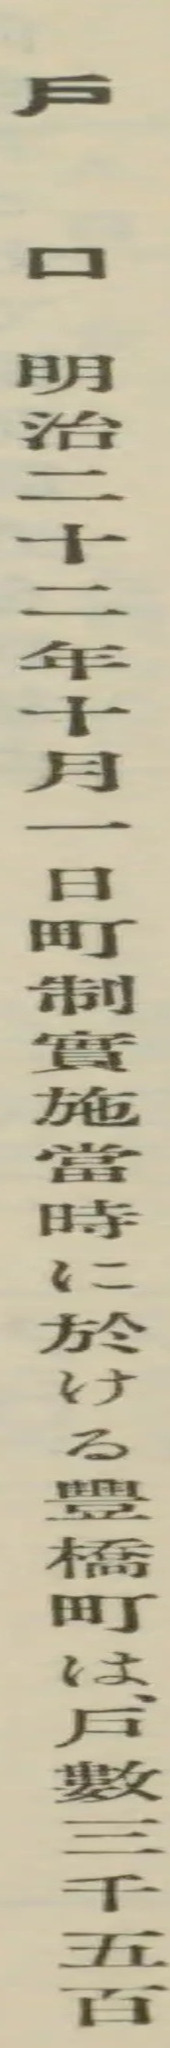戸口明治二十二年十月一日町制実施当時に於ける豊橋町は、戸数三千五百
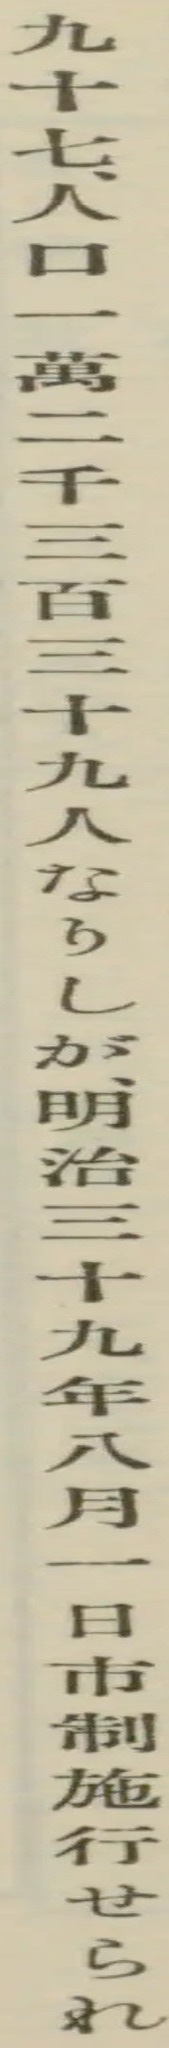九十七、人口一萬二千三百三十九人なりしが、明治三十九年八月一日市制施行せられ
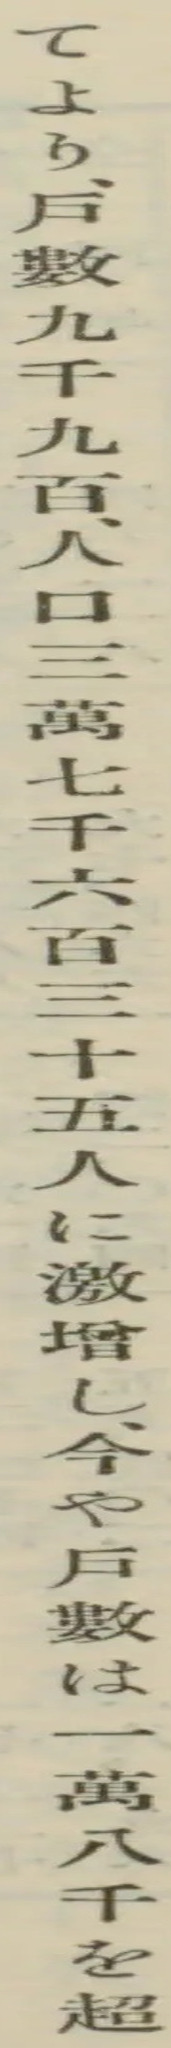てより戸数九千九百、人口三萬七千六百三十五人に激増し、今や戸数は一萬八千を超
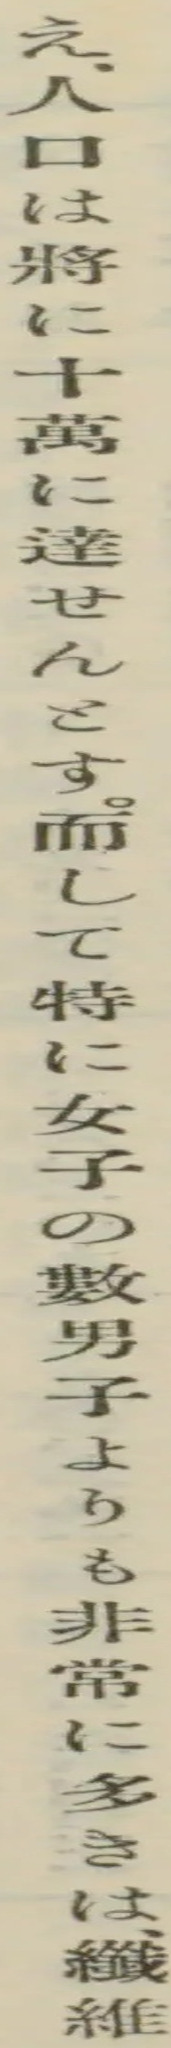え、人口は将に十萬に達せんとす。而して特に女子の数男子よりも非常に多きは、繊維
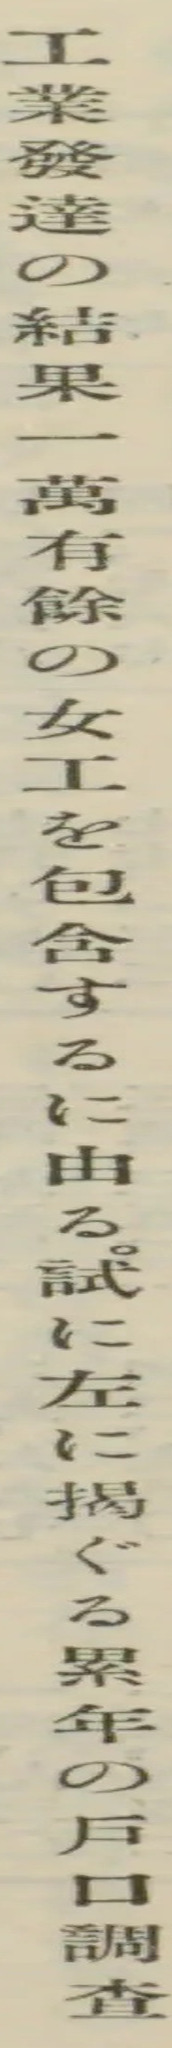工業発達の結果一萬有余の女工を包含するに由る。試に掲ぐる累年の戸口調査
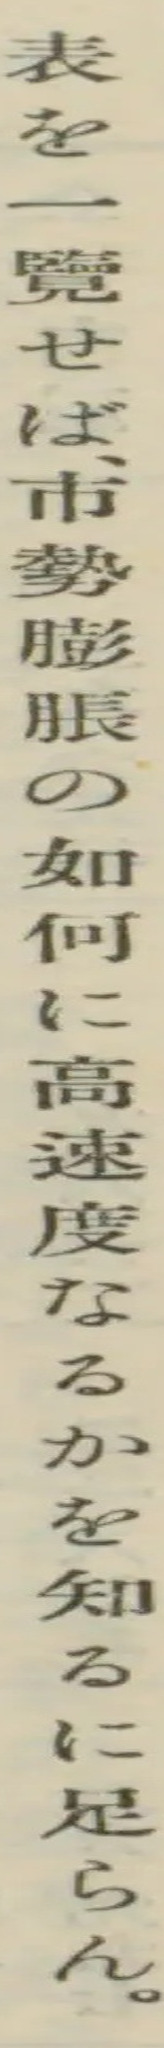表を一覧せば、市勢膨張の如何に高速度なるかを知るに足らん。
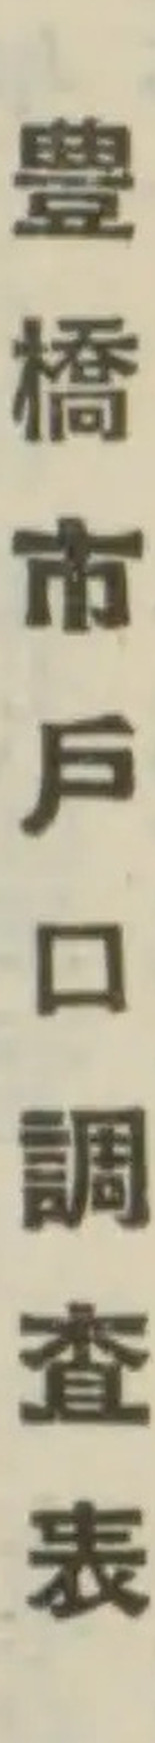豊橋市戸口調査表
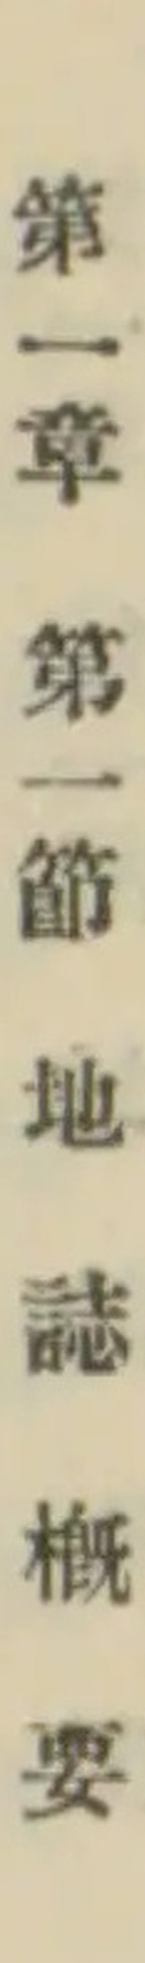第一章第一節地誌概要二

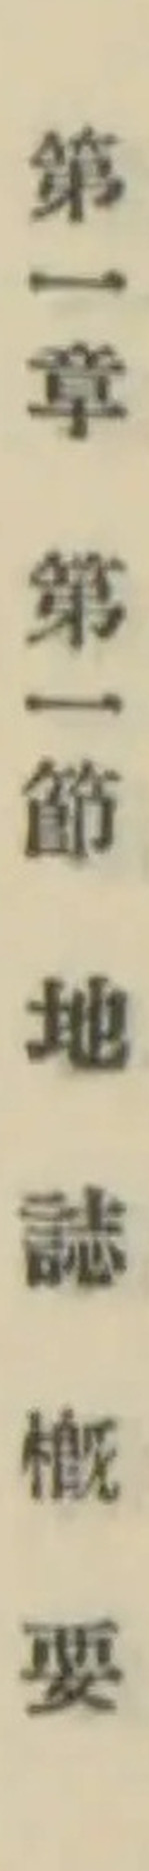第一章第一節地誌概要四
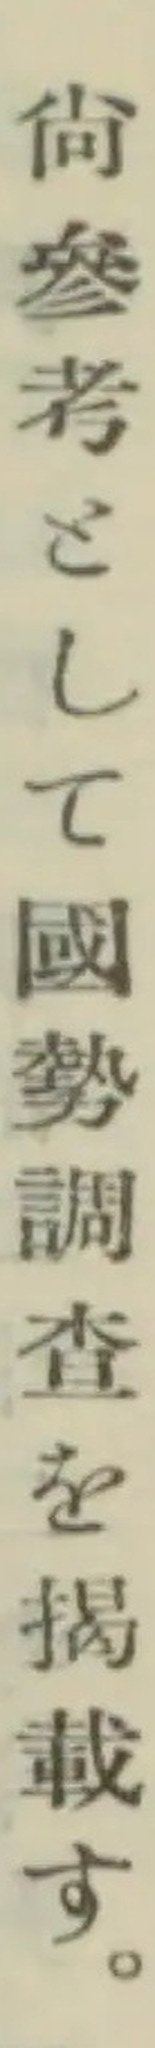尚参考として国勢調査を掲載す。
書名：豊橋市水道誌
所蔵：国立国会図書館 National Diet Library, JAPAN
